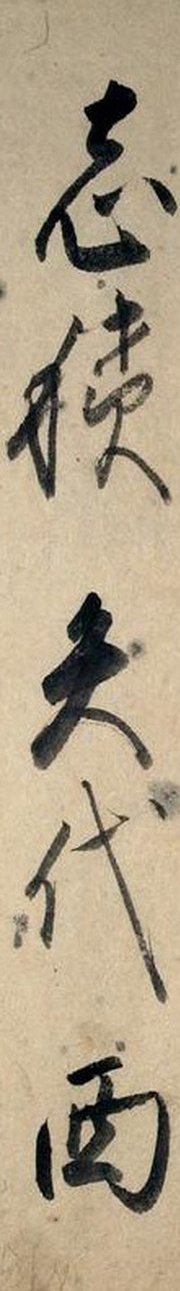志積矢代西
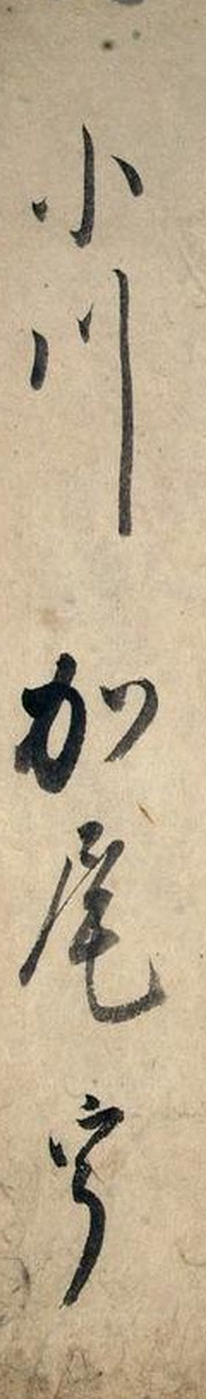小川加尾宇

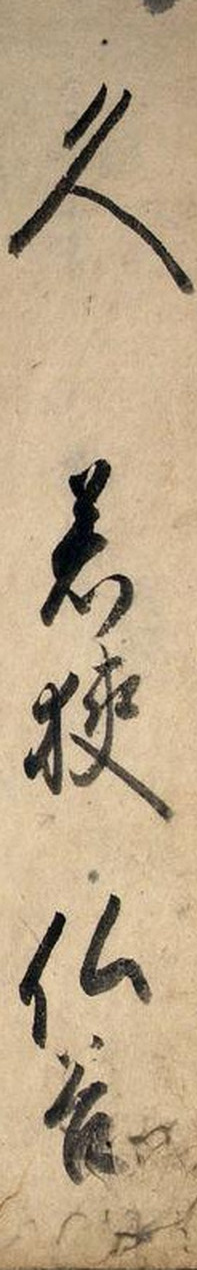久若狭仏谷
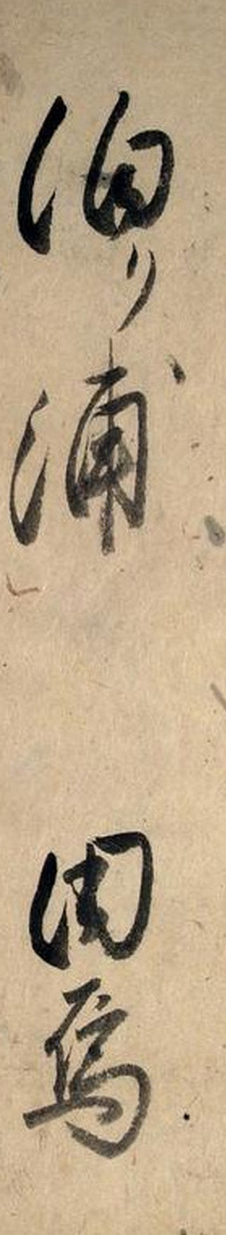泊リ浦田烏
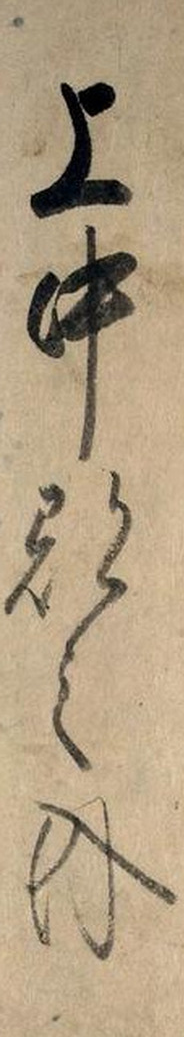上中郡之内
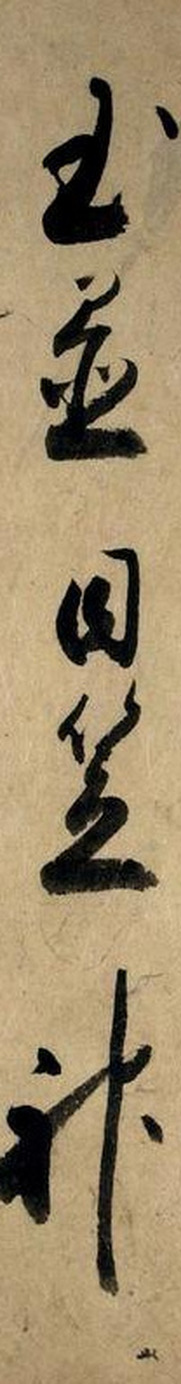日置日笠神
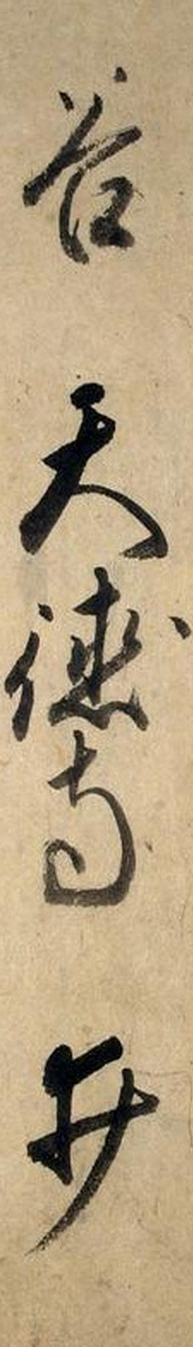谷天徳寺井
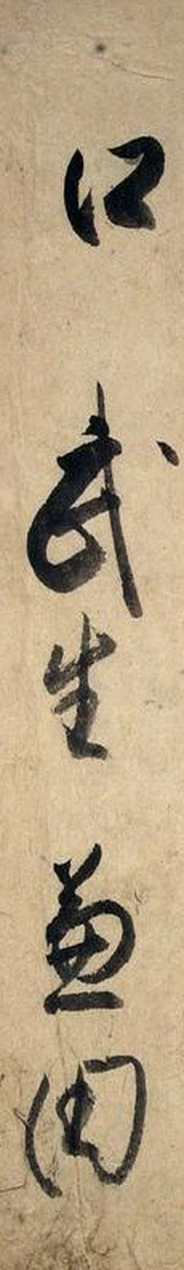口武生兼田

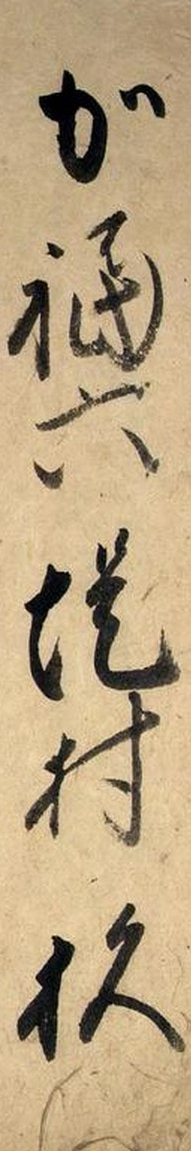加福六堤村杉
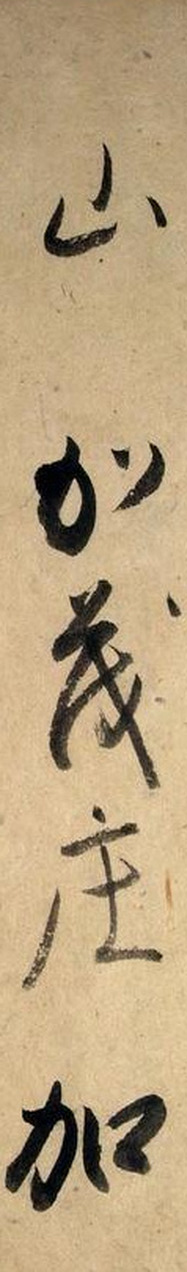山加茂庄加
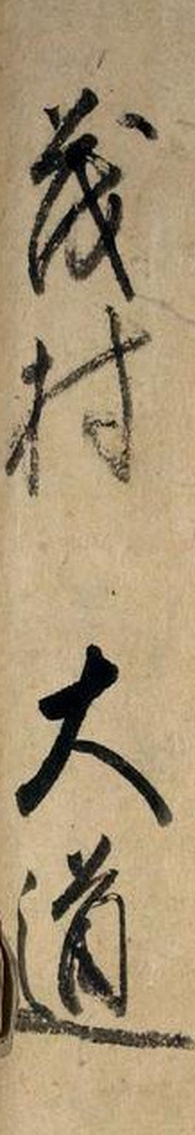茂村大道
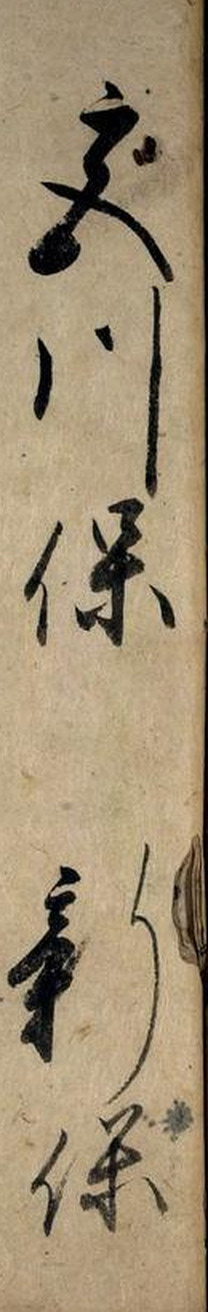宮川保新保
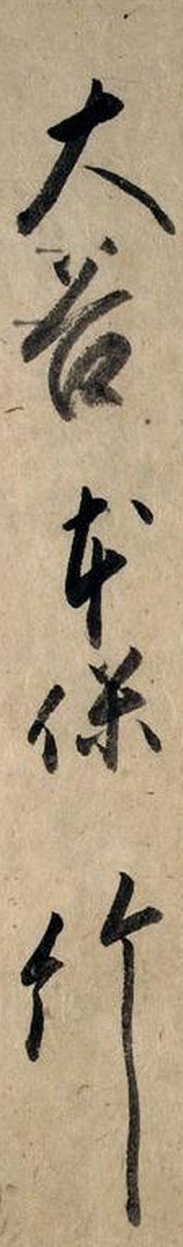大谷本保竹
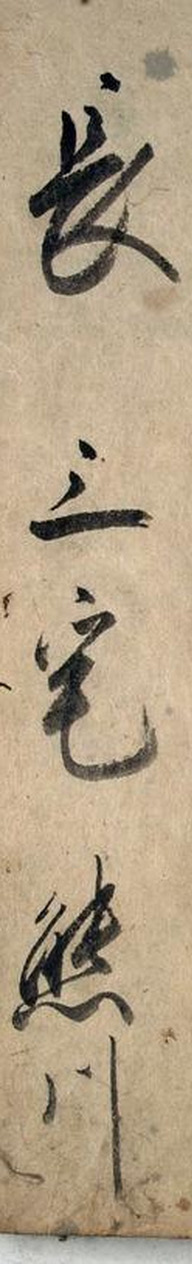長三宅熊川

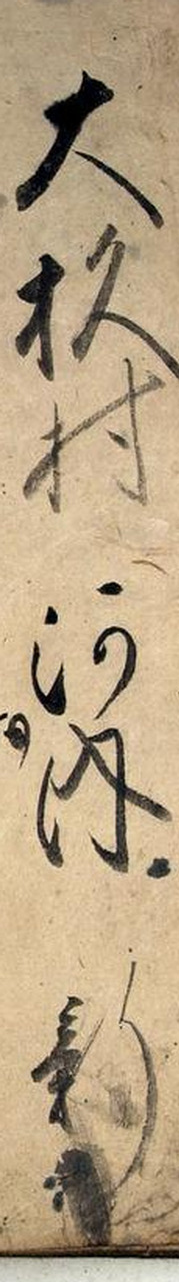大杉村河内新
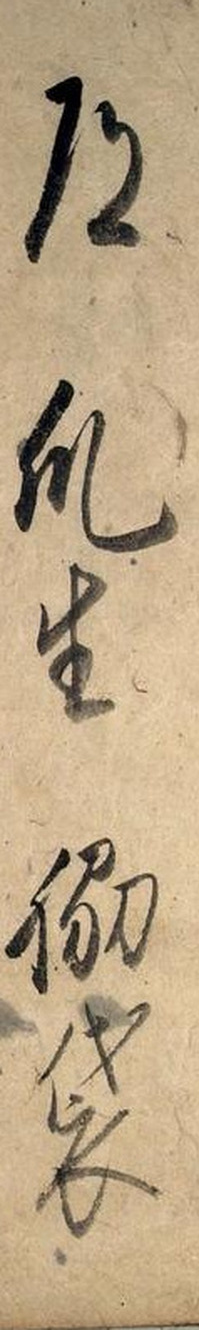道瓜生脇袋
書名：御手本（手習、家号之事、小浜商家の屋号）
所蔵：福井県文書館 Fukui Prefectural Archives
